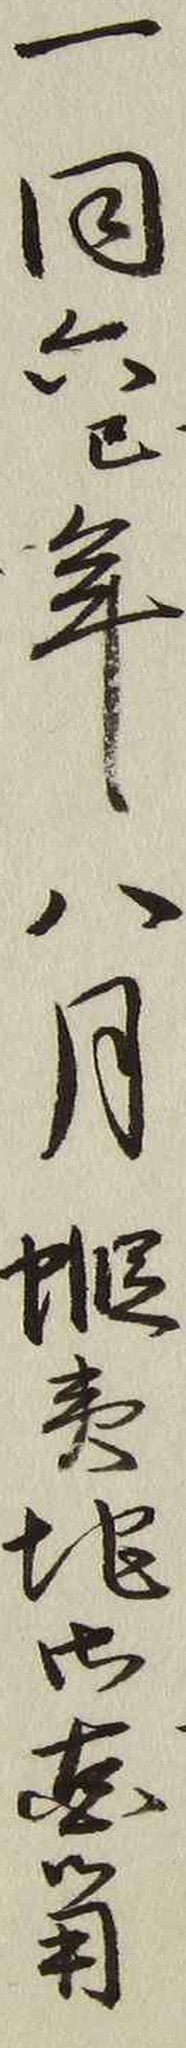一同六巳年八月蝦夷地御固御用
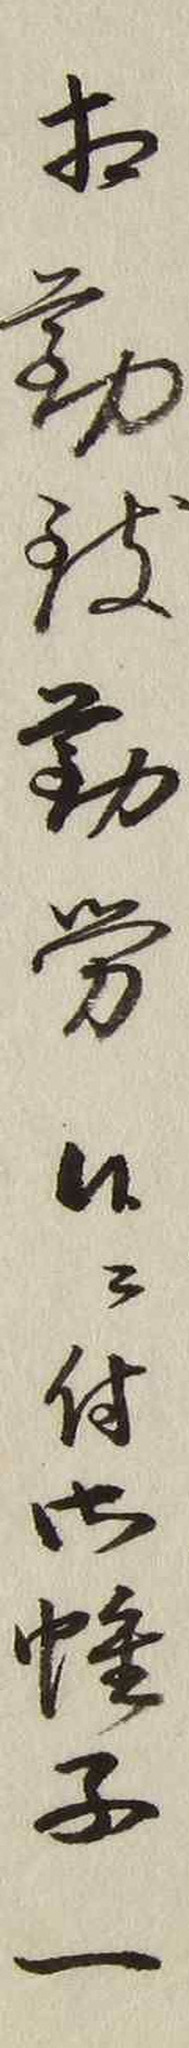相勤致勤労候ニ付御帷子一
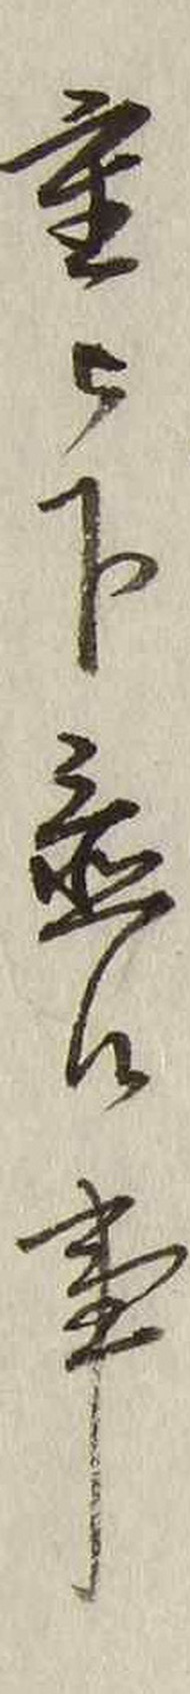重被下置候事
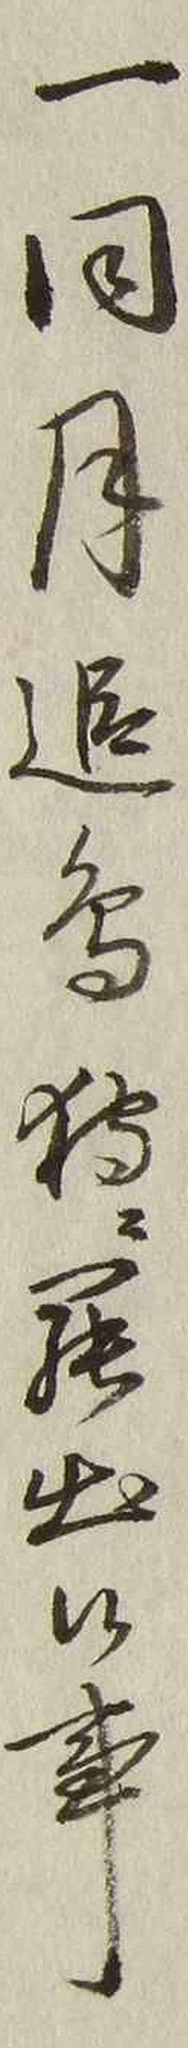一同月追鳥狩ニ罷出候事

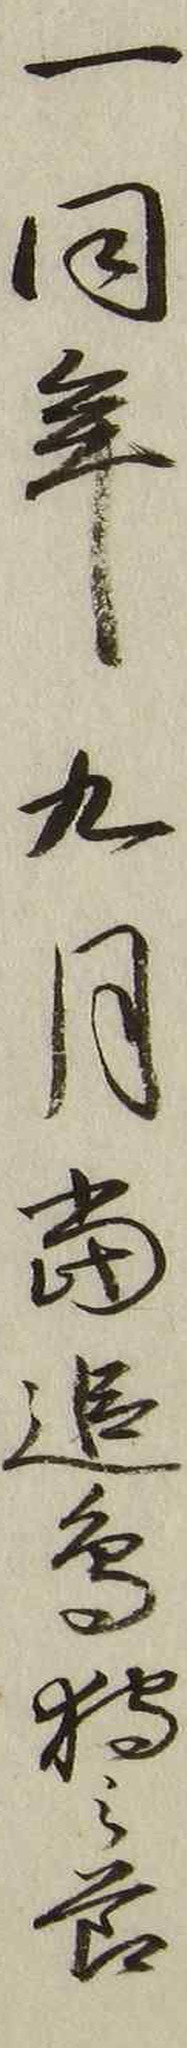一同年九月当追鳥苅狩之節
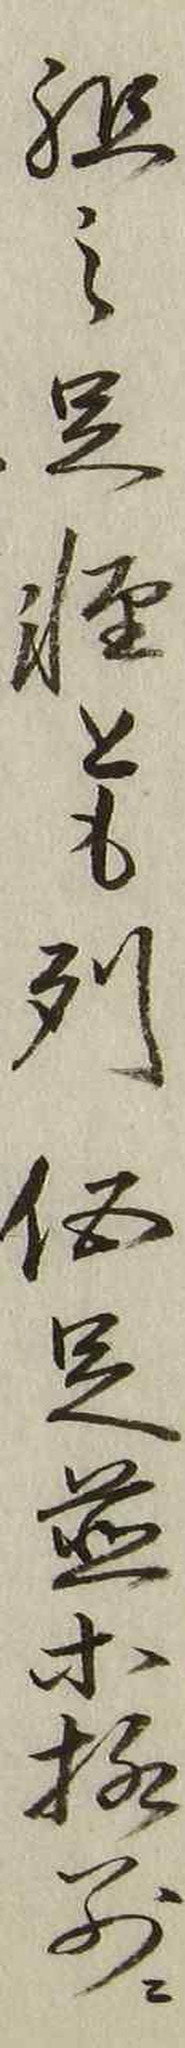組之足軽ととも列伍足並等揃別ニ
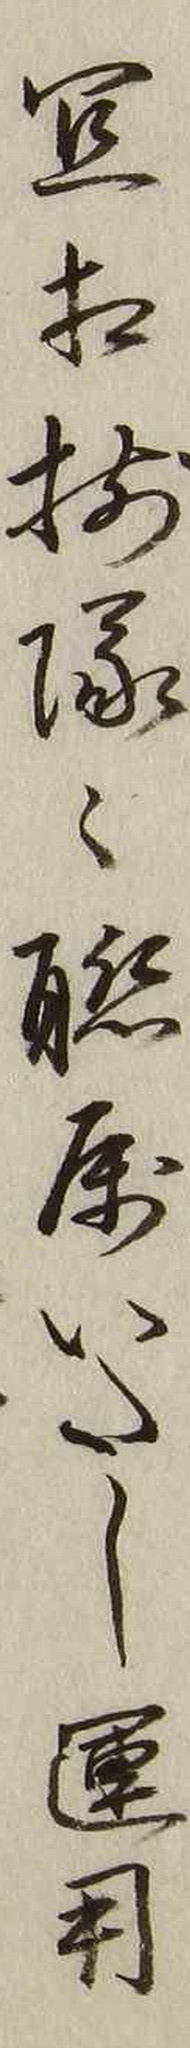宜相揃隊之聯属いたし運用
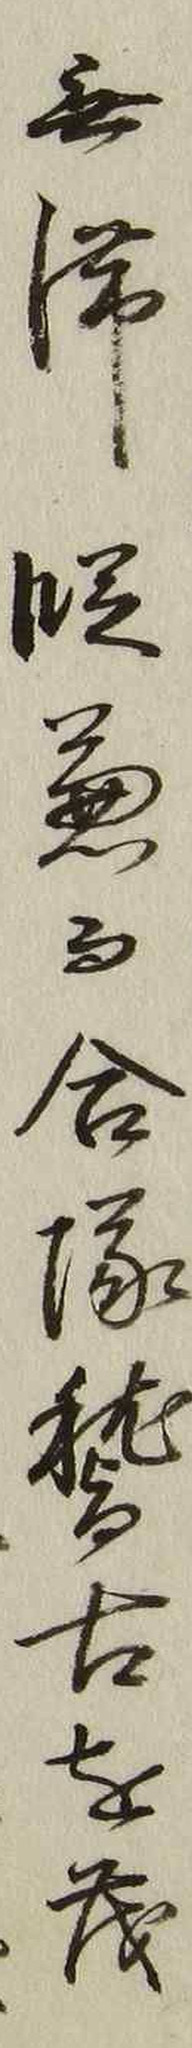無滞段兼而合隊稽古を茂
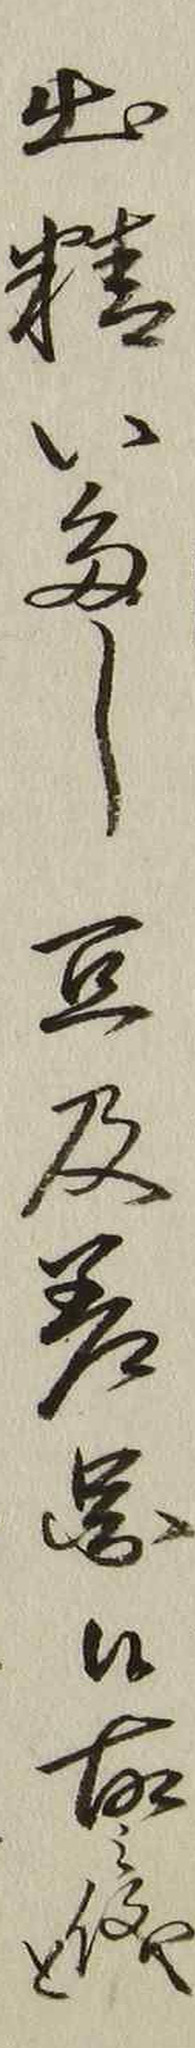出精いたし宜及差図候故之儀と
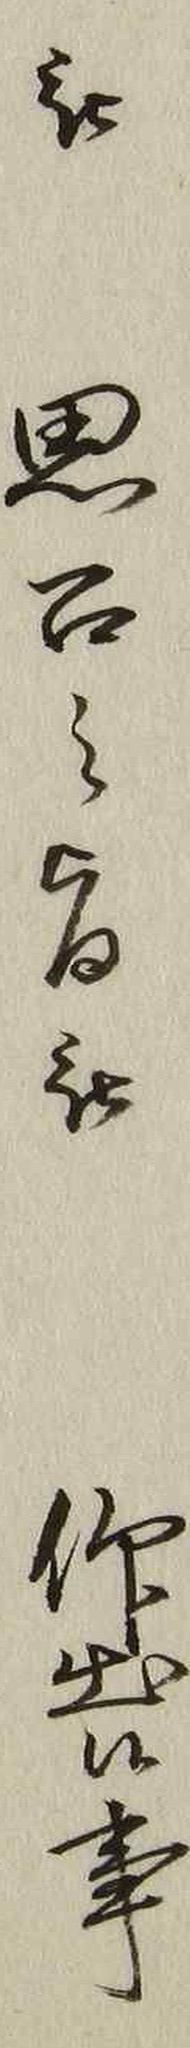被思召之旨被仰出候事
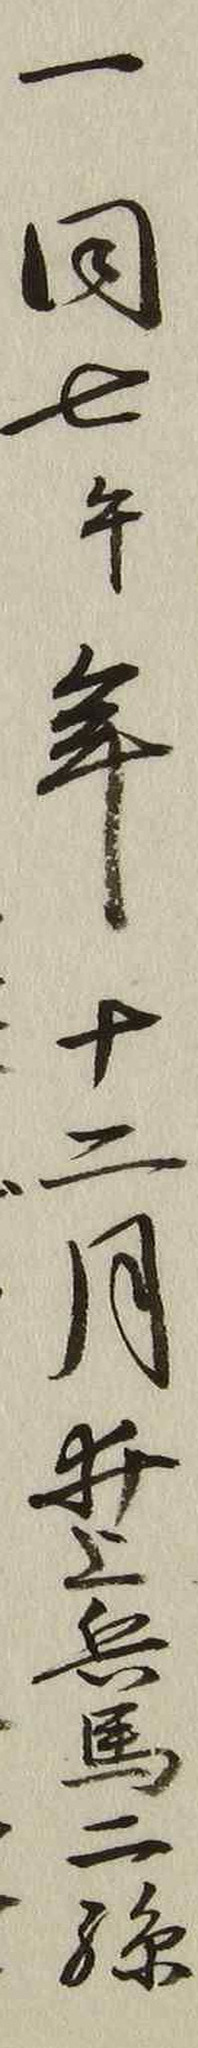一同七午年十二月井上兵馬二孫
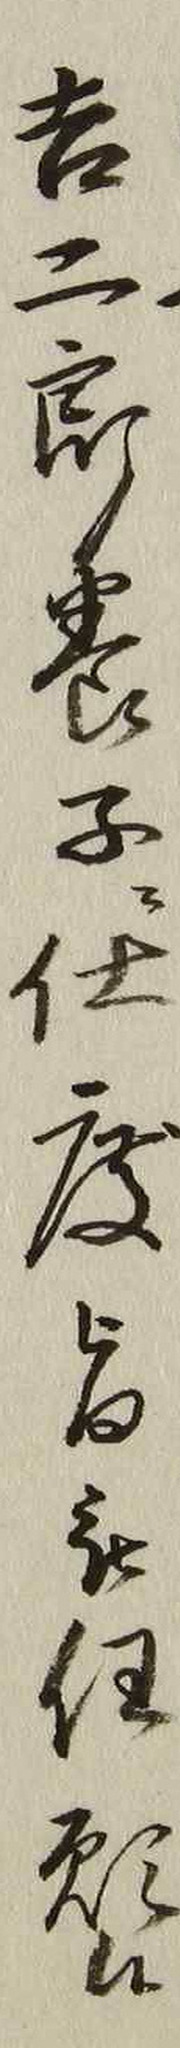吉二郎養子ニ仕度旨被任願候
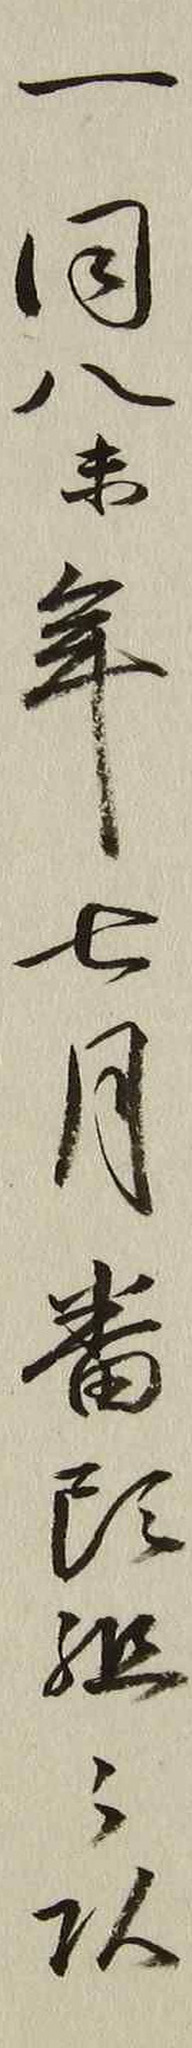一同八未年七月番頭組之頭
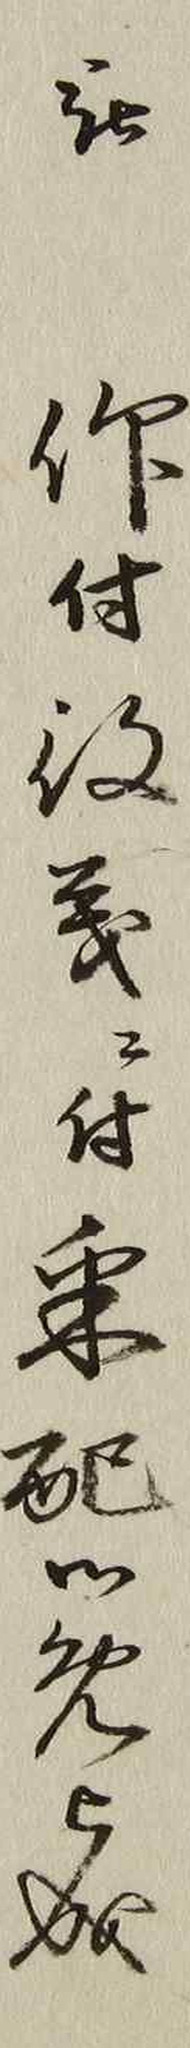被仰付致義ニ付采配御免被成
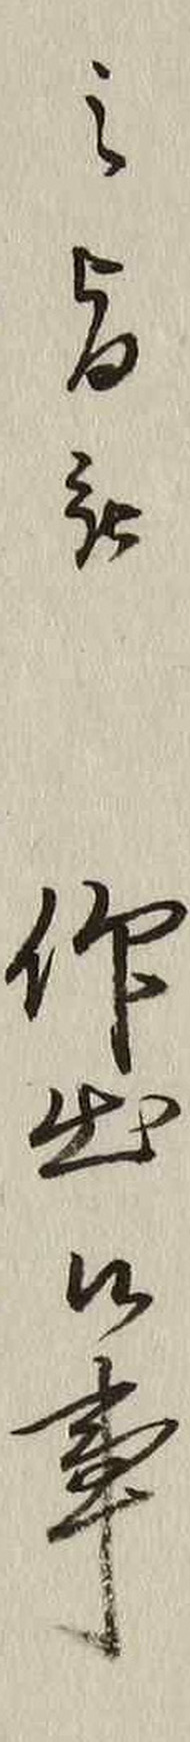之旨被仰出候事
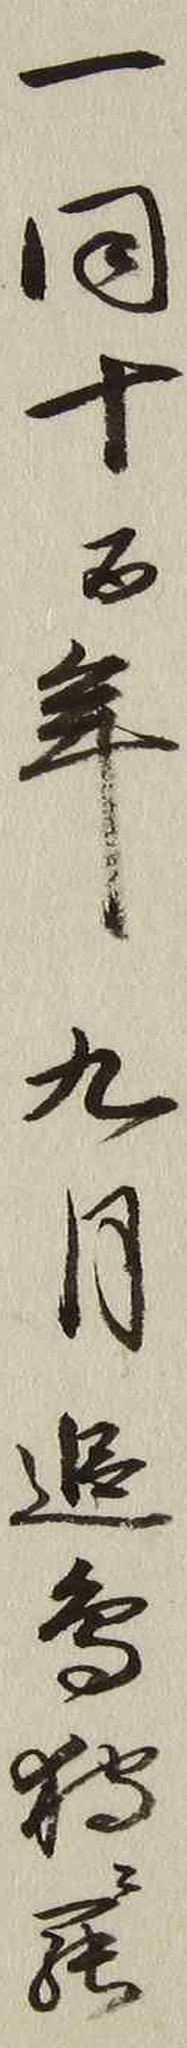一同十酉九月追鳥苅狩ニ罷
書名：諸士系譜　巻之136　た之部12
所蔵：会津若松市立会津図書館
